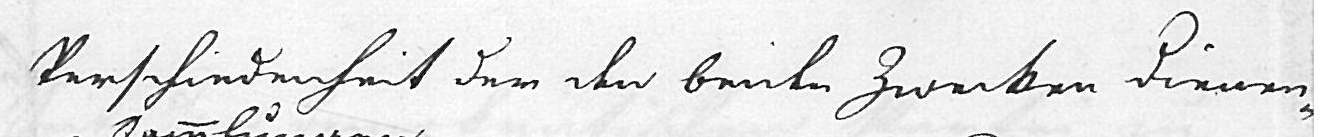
Verschiedenheit der den beiden Zwecke dienen-
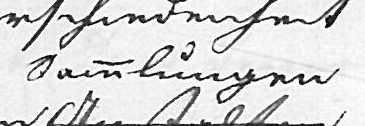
Sammlungen
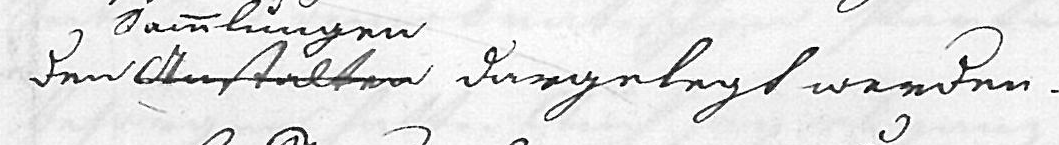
den Anstalten dargelegt werden.
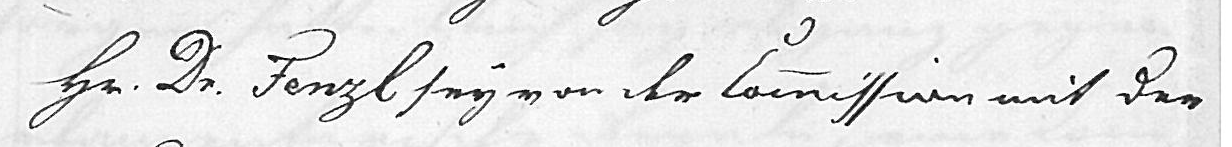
Hr. Dr. Fenzl sey von der Commission mit der
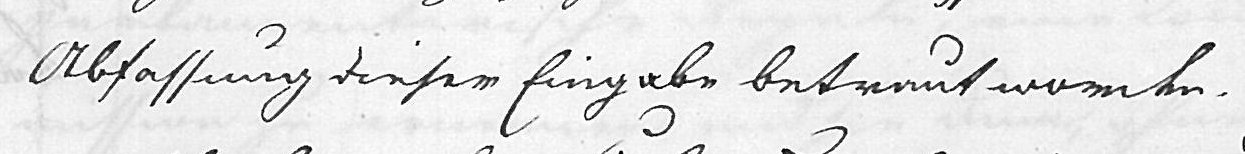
Abfassung dieser Eingabe betraut worden.
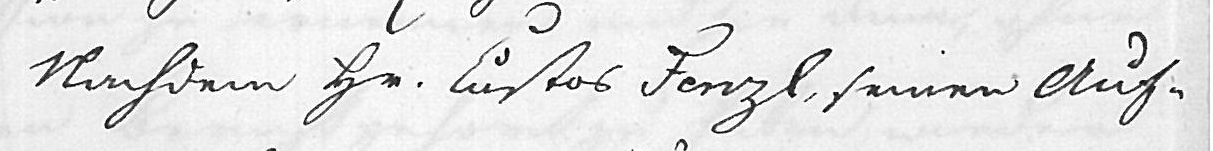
Nachdem Hr. Custos Fenzl seinen Auf-
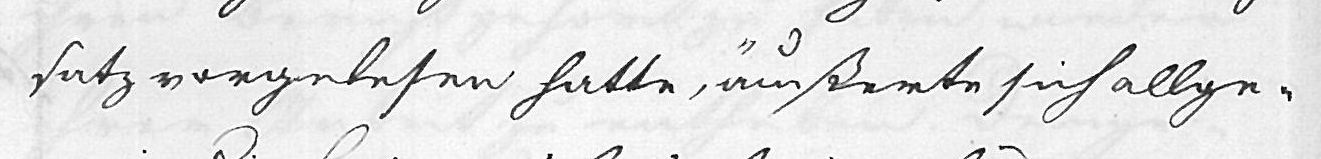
satz vorgelesen hatte, äußerte sich allge-
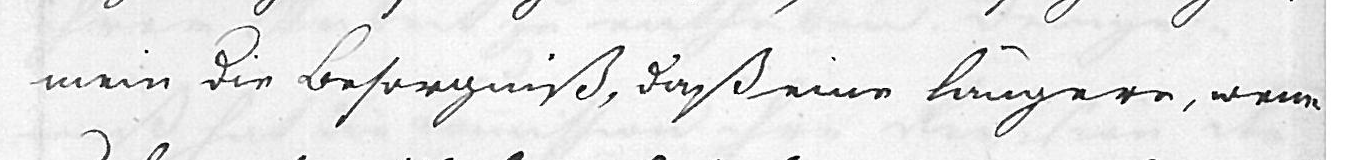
mein die Besorgniß, daß eine längere, wenn
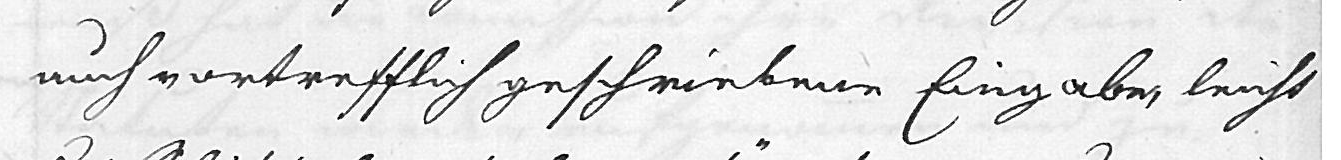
auch vortrefflich geschriebene Eingabe, leicht
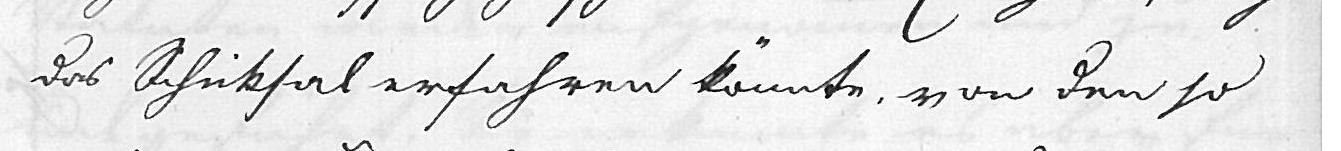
das Schicksal erfahren könnte, von den so
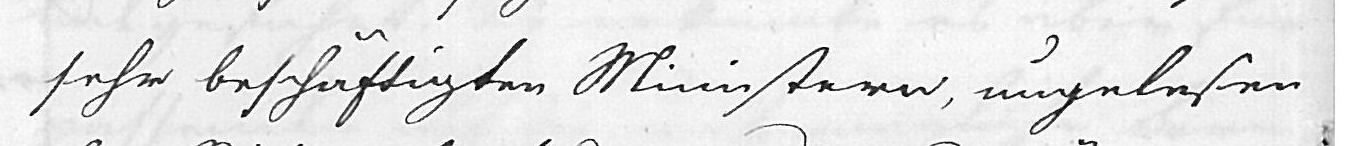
sehr beschäftigten Ministern, ungelesen
